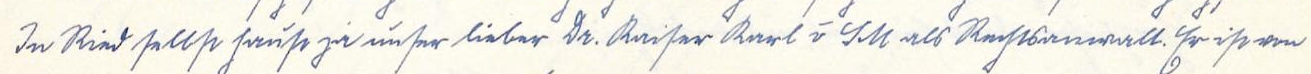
In Ried selbst haust ja unser lieber Dr. Kaiser Karl v/o SM als Rechtsanwalt. Er ist von
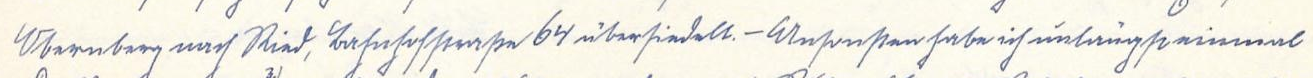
Obernberg nach Ried, Bahnhofstraße 64 übersiedelt. Ansonsten habe ich unlängst einmal
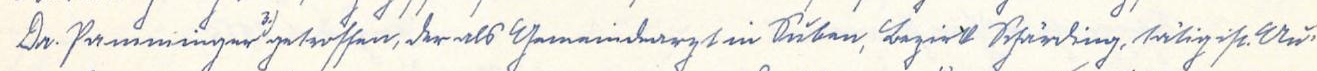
Dr. Pamminger 3) getroffen, der als Gemeindearzt in Suben, Bezirk Schärding tätig ist. Au-
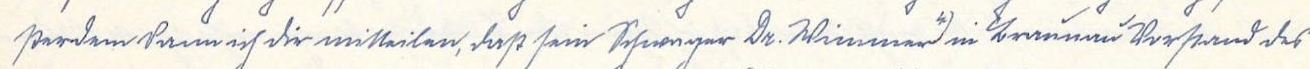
ßerdem kann ich dir mitteilen, daß sein Schwager Dr. Wimmer 4) in Braunau Vorstand des
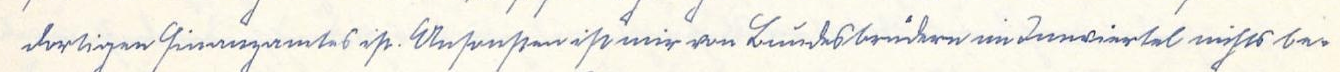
dortigen Finanzamtes ist. Ansonsten ist mir von Bundesbrüdern im Innviertel nichts be-
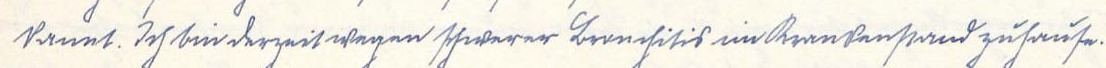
kannt. Ich bin derzeit wegen schwerer Bronchitis im Krankenstand zuhause
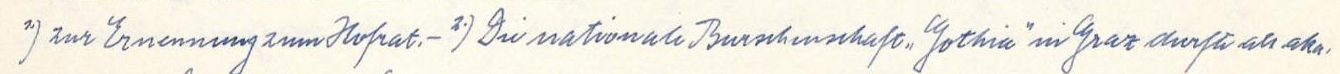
1) Zur Ernennung zum Hofrat. – 2) Die nationale Burschenschaft „Gothia“ in Graz durfte als aka-
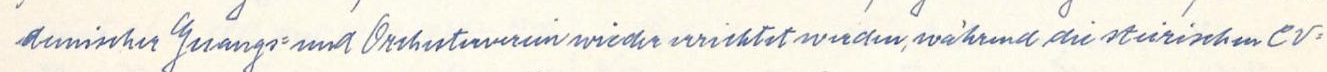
demischer Gesangs- und Orchesterverein wieder errichtet werden, während die steirischen CV-
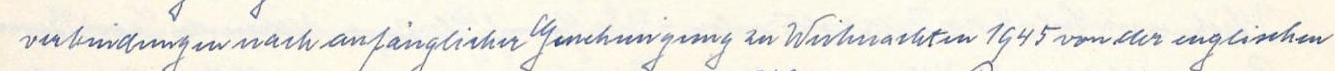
Verbindungen nach anfänglicher Genehmigung zu Weihnachten 1945 von der englischen
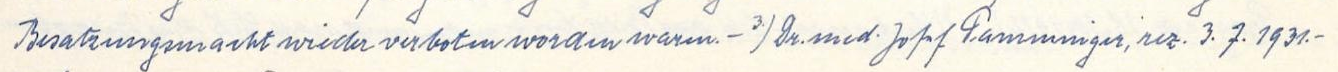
Besatzungsmacht wieder verboten worden waren. – 3) Dr. med. Josef Pamminger, rez. 3.7. 1931.-
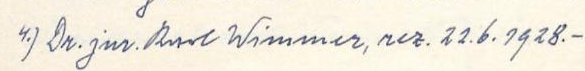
4) Dr. iur. Karl Wimmer rez. 22. 6. 1928.
